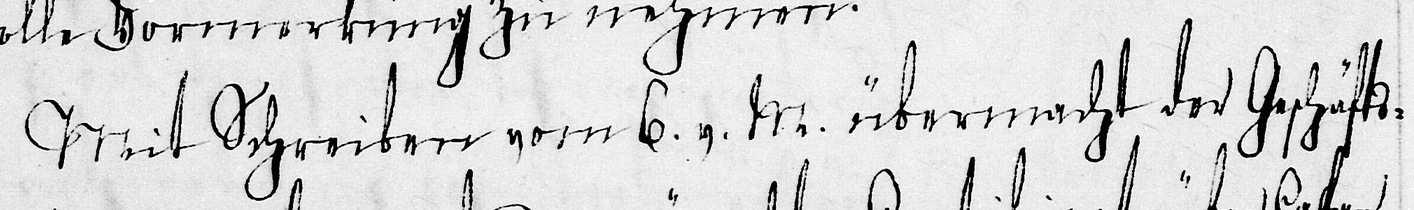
Mit Schreiben vom 6. v. M. übermacht der Geschäft¬
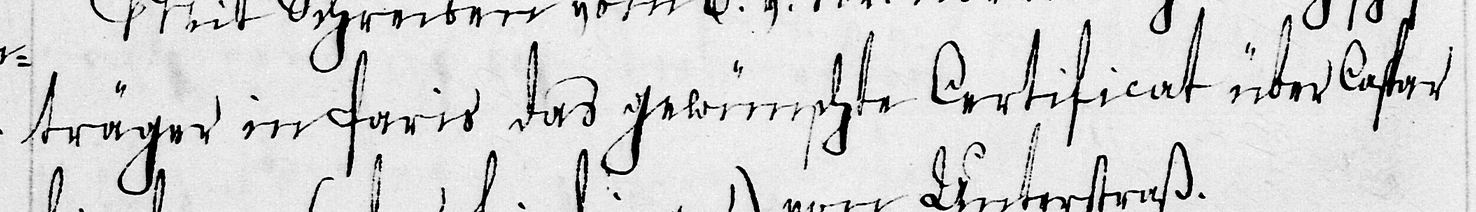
sträger in Paris das gewünschte Certificat über Caspar
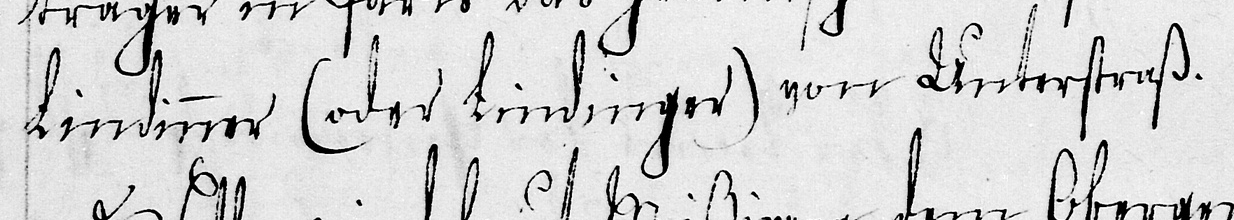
Lindinner (oder Lindinger) von Unterstraß.
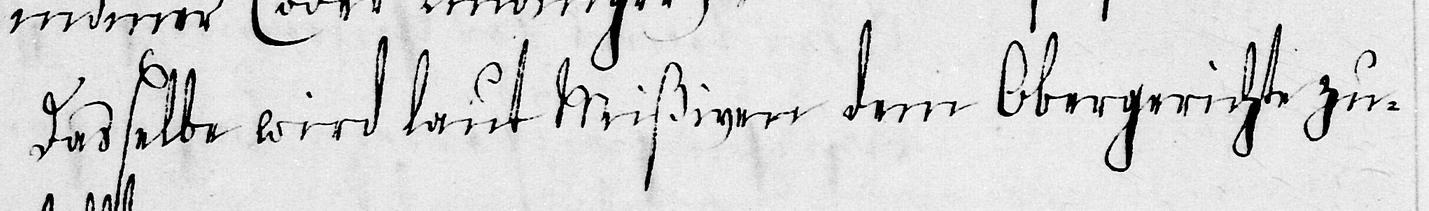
Dasselbe wird laut Mißiven dem Obergerichte zu¬
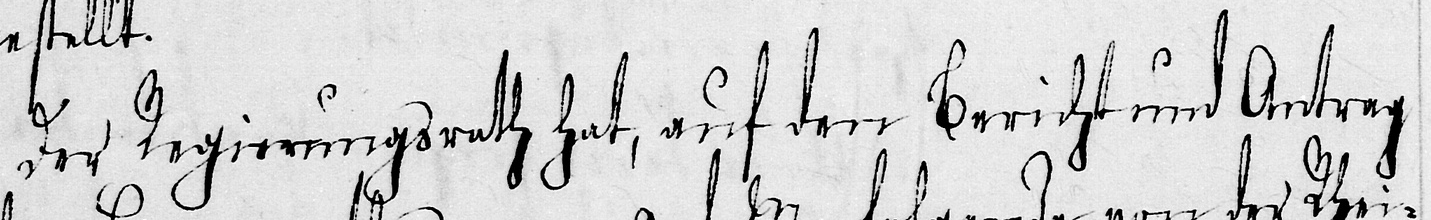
Der Regierungsrath hat, auf den Bericht und Antrag
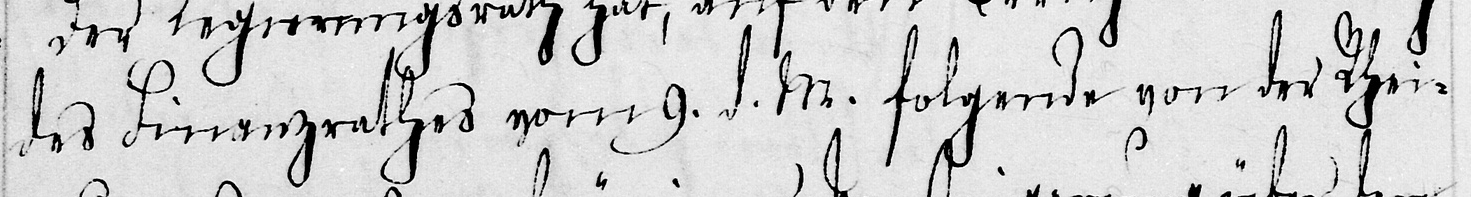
des Finanzrathes vom 9. d. M. folgende von der Rhei¬
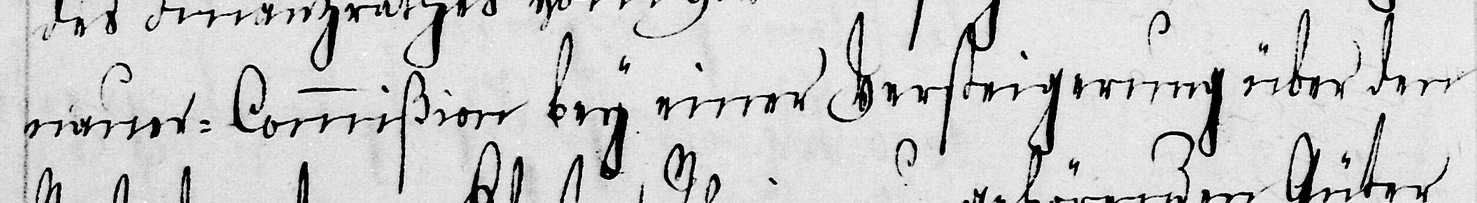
nauer-Commißion bey einer Versteigerung über den
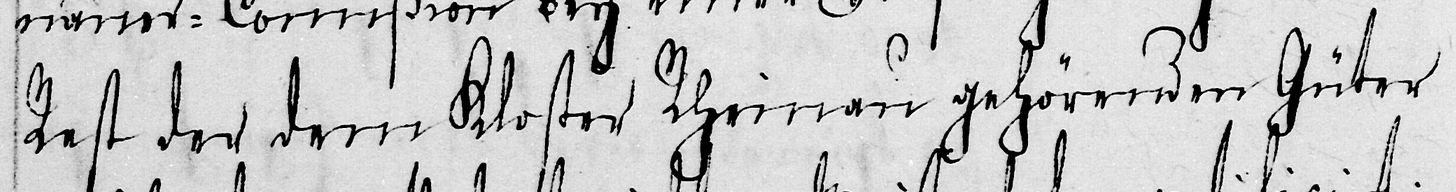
Rest der dem Kloster Rheinau gehörenden Güter
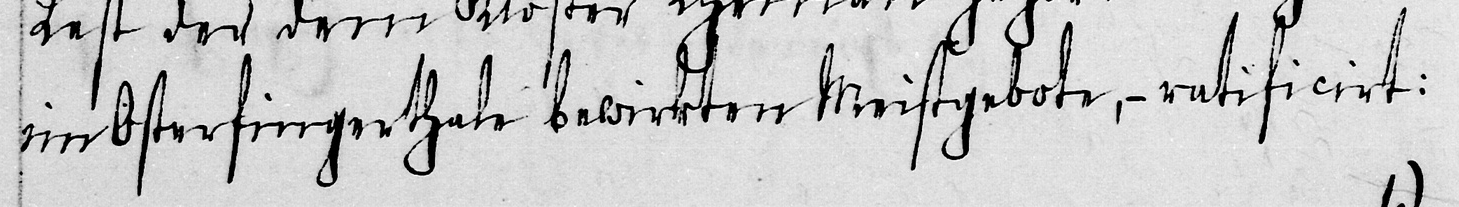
im Osterfingerthale bewirkten Meistgebote, – ratificirt:
